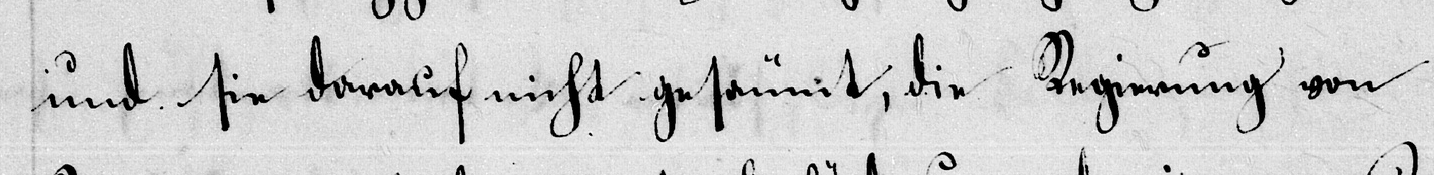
und sie darauf nicht gesäumt, die Regierung von
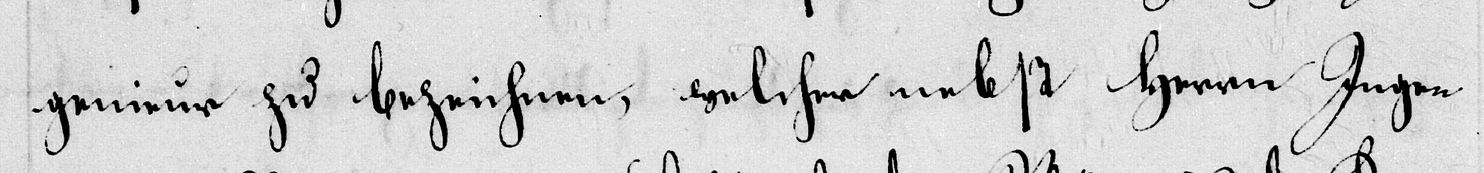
genieur zu bezeichnen, welcher nebst Herrn Ingen¬
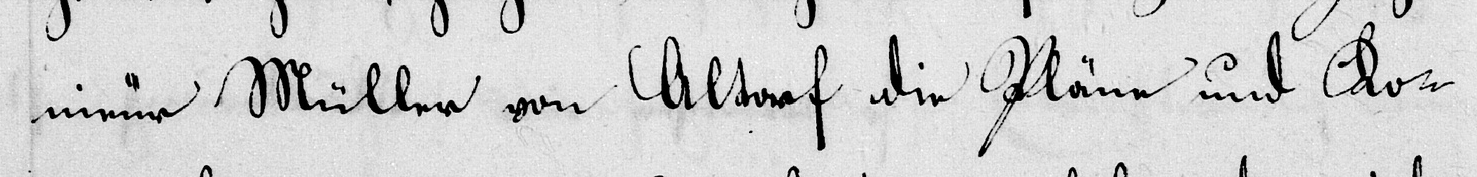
ieur Müller von Altorf die Pläne und Ko¬
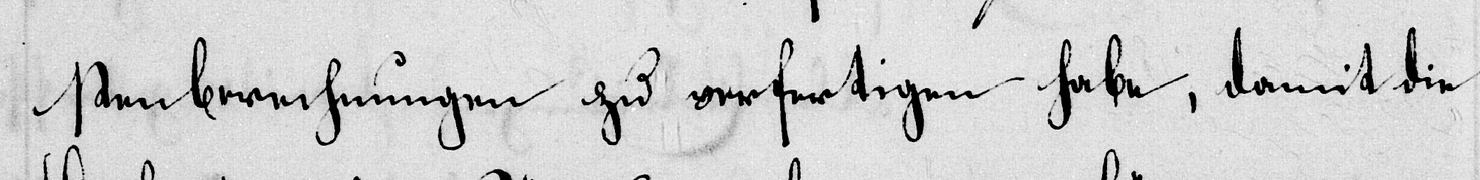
stenberechnungen zu verfertigen habe, damit die
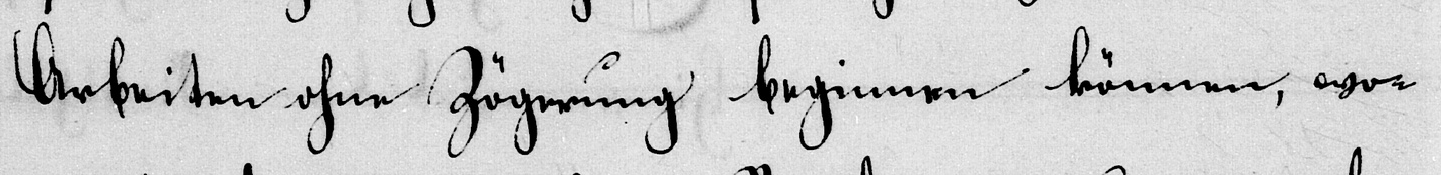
Arbeiten ohne Zögerung beginnen können, wo¬
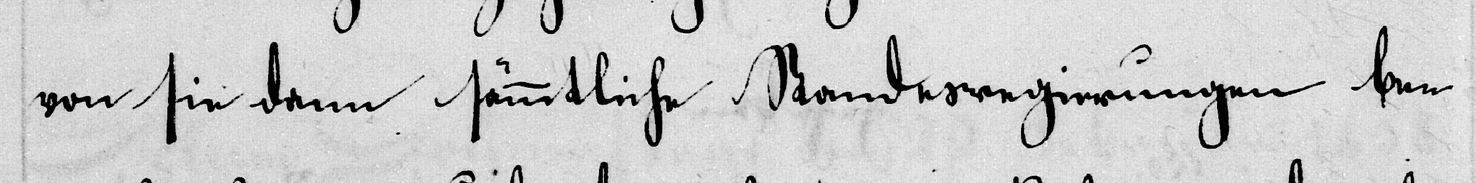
von sie dann sämmtliche Standesregierungen be¬
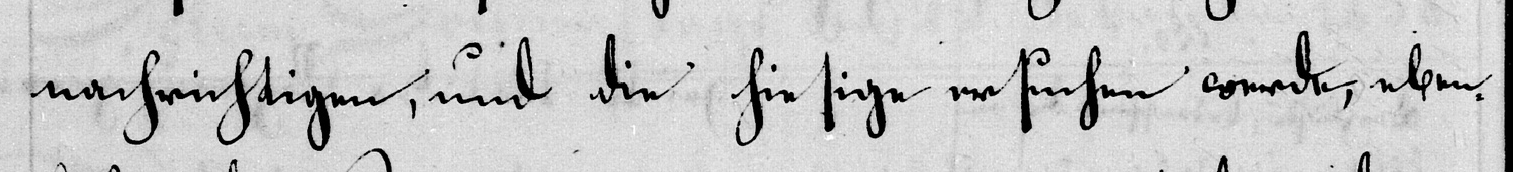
nachrichtigen, und die hiesige ersuchen werde, eben¬
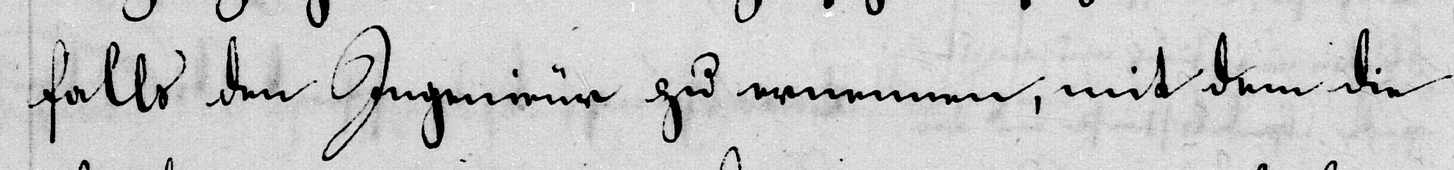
falls den Ingenieur zu ernennen, mit dem die
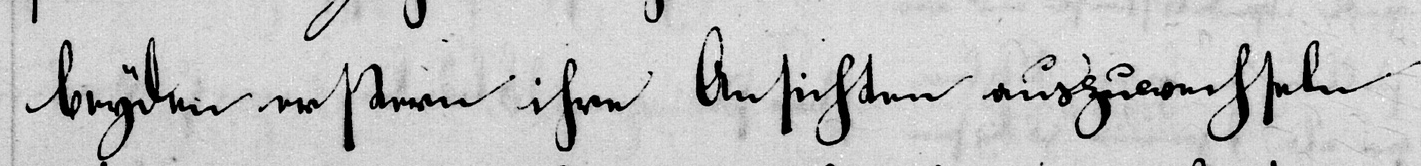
beyden ersteren ihre Ansichten auszuwechseln
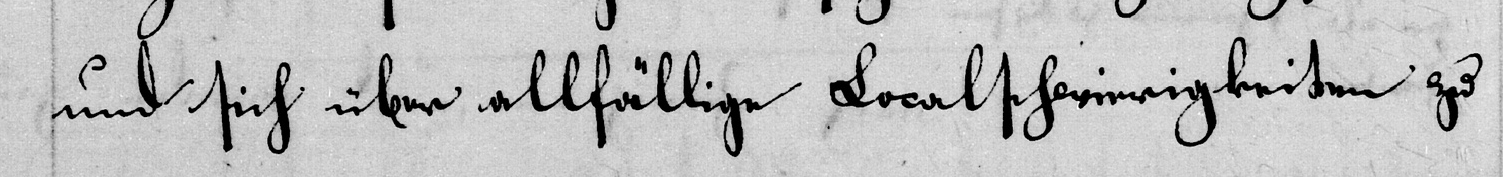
und sich über allfällige Localschwierigkeiten zu
